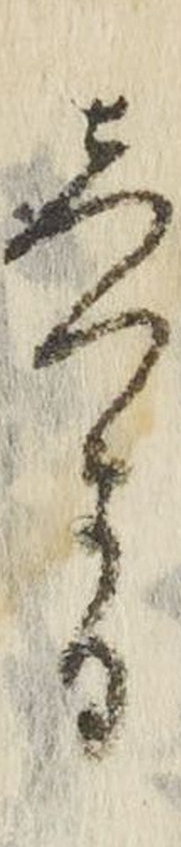しつまる
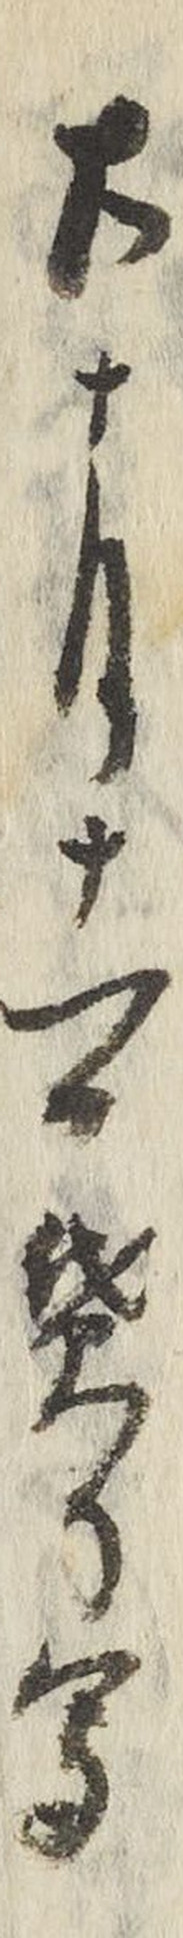右十月十一日貸り写
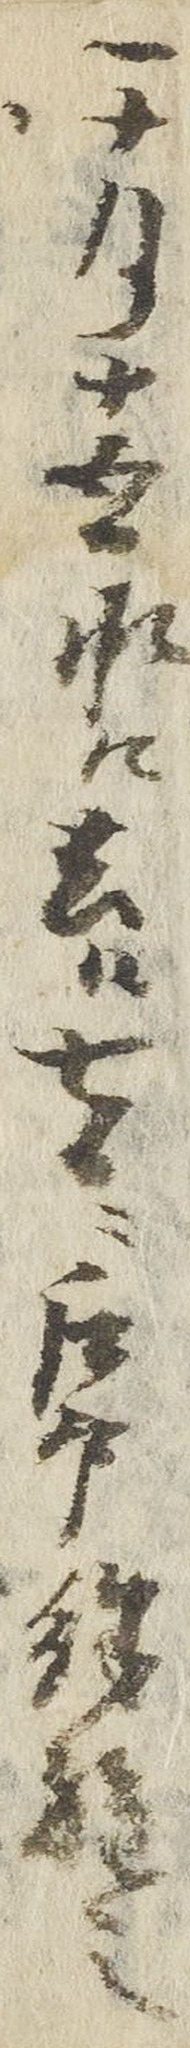一十月十五日承ル去ル七日ニ江戸余程之
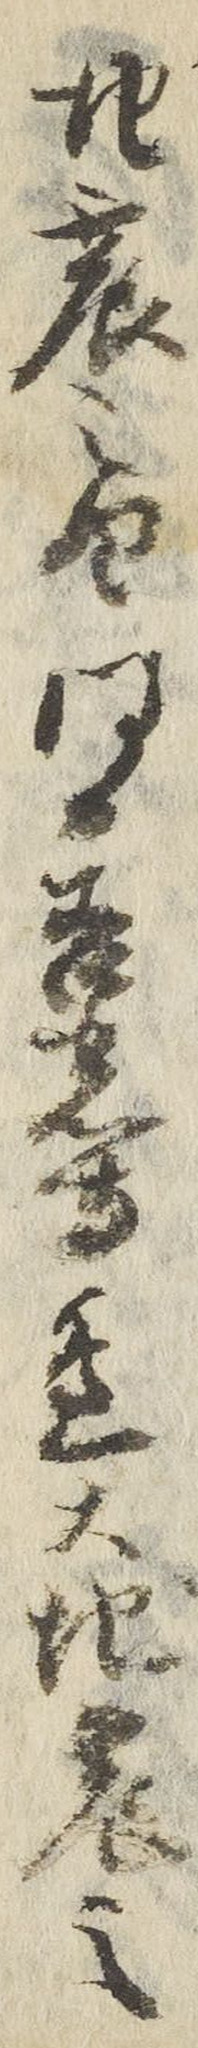地震之由同日善光寺辺大地震之
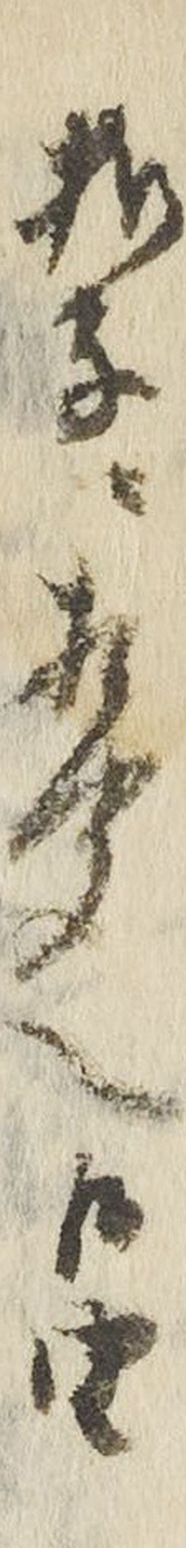様子ニ相聞へ候由
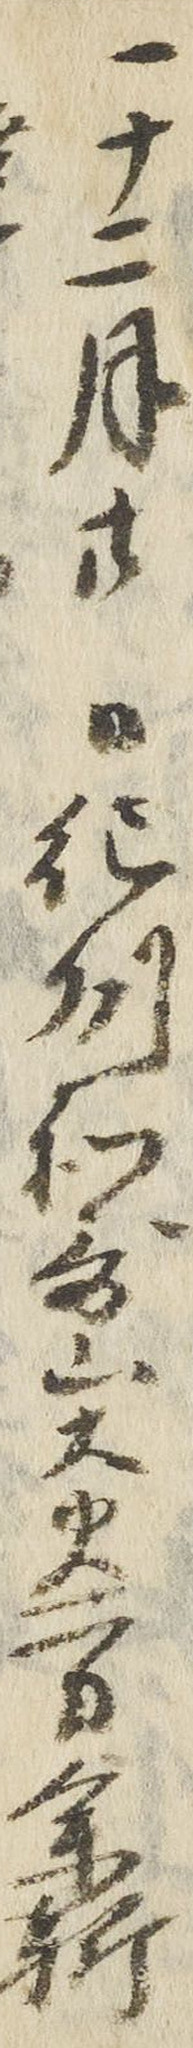一十二月廿日紀州和歌山大火一万余軒
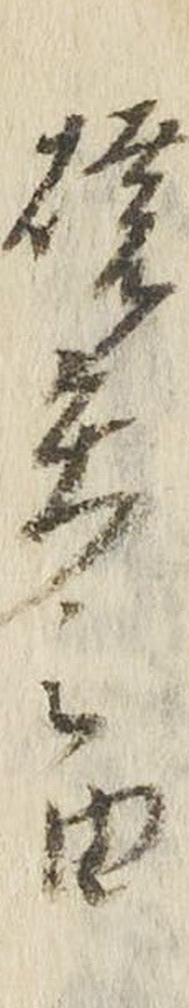焼失之由
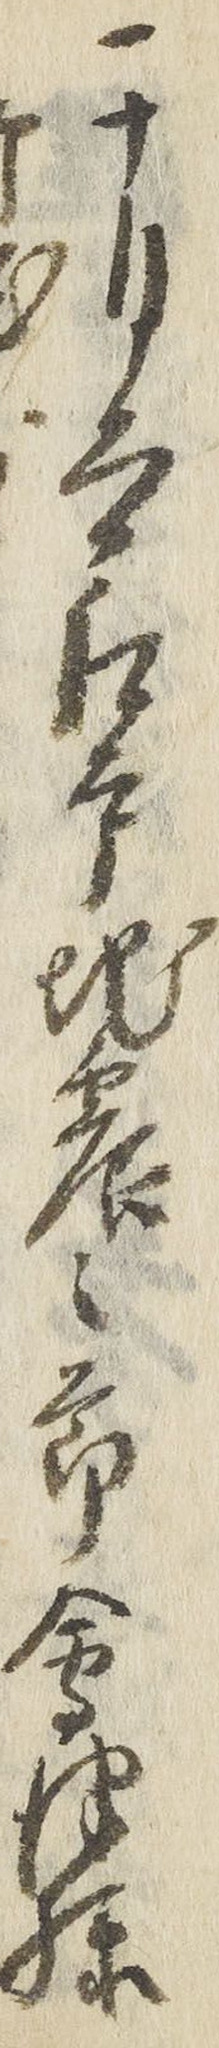一十月二日江戸地震之節会津様
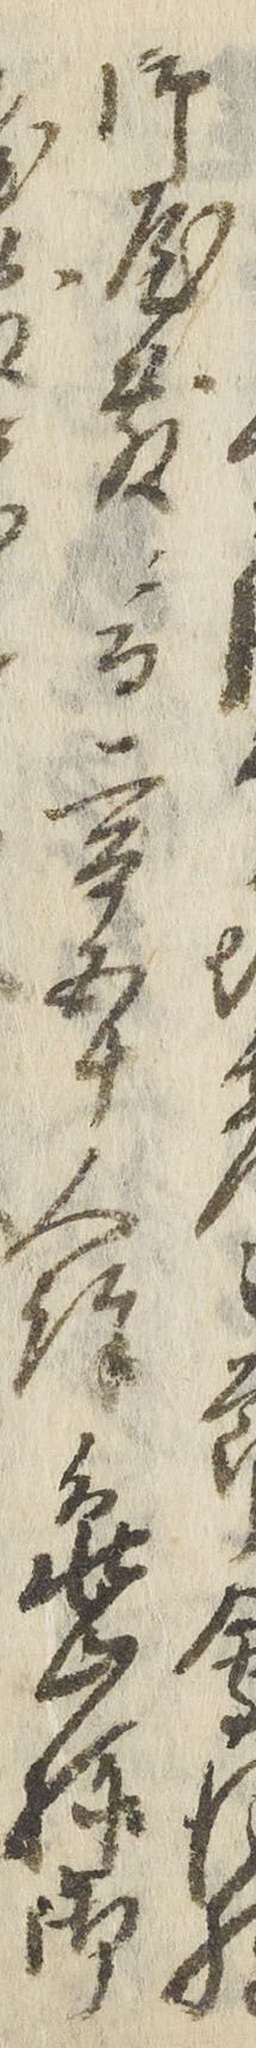御屋敷ニ而二百五十人余亀山様御
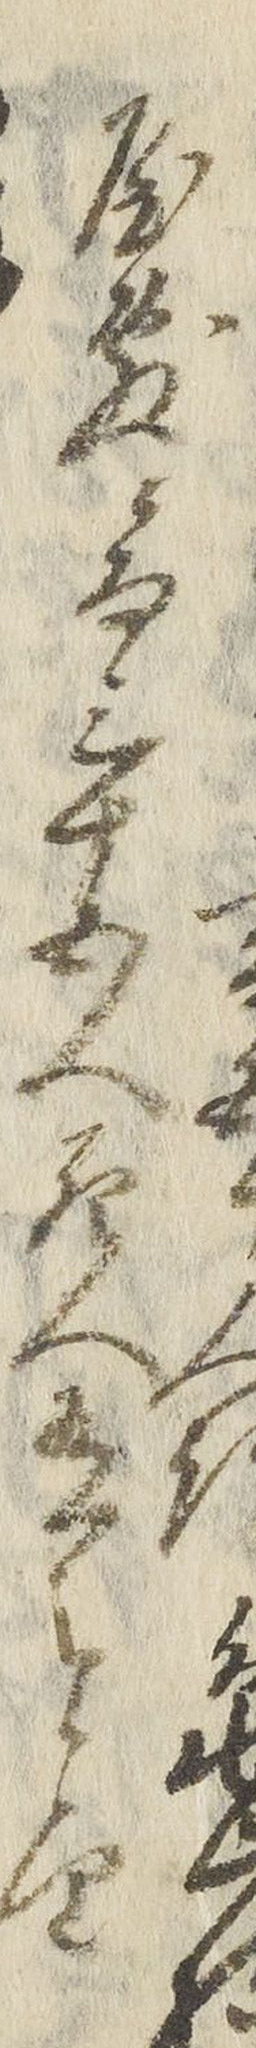屋敷ニ而三十五人死人有之候由
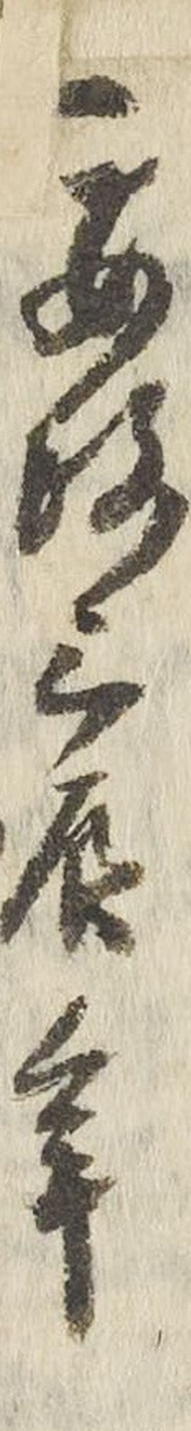一安政三辰年
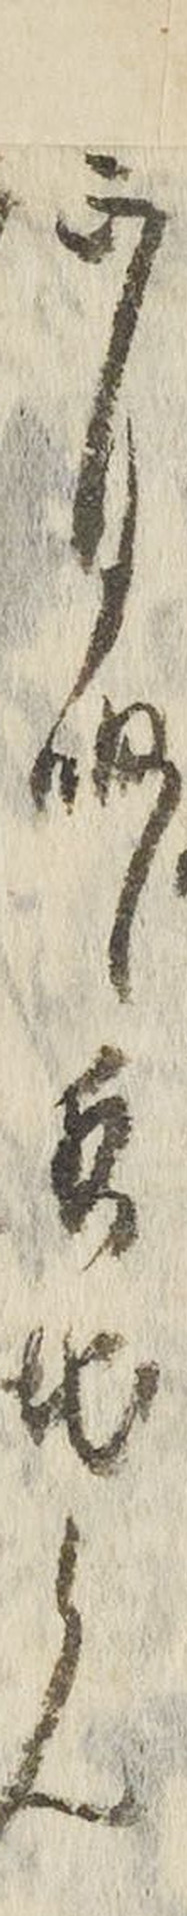正月晦日夜地しん
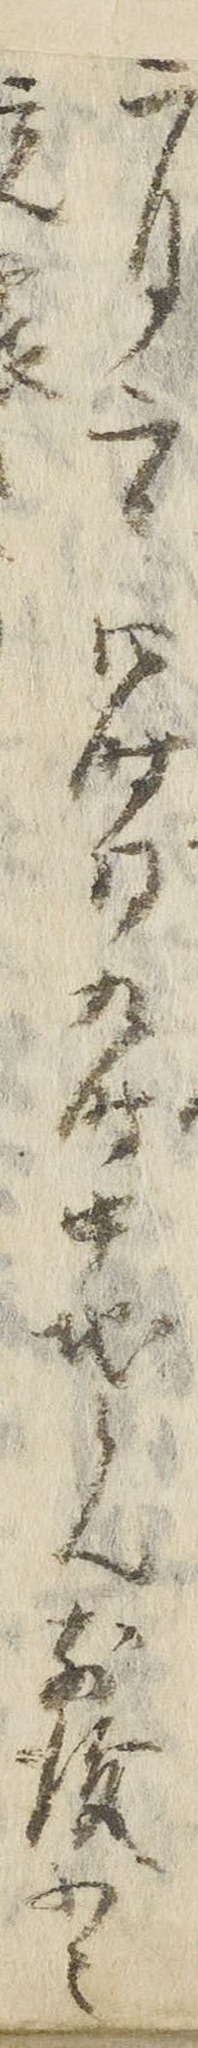二月二日四時同九時中地しん前後少々
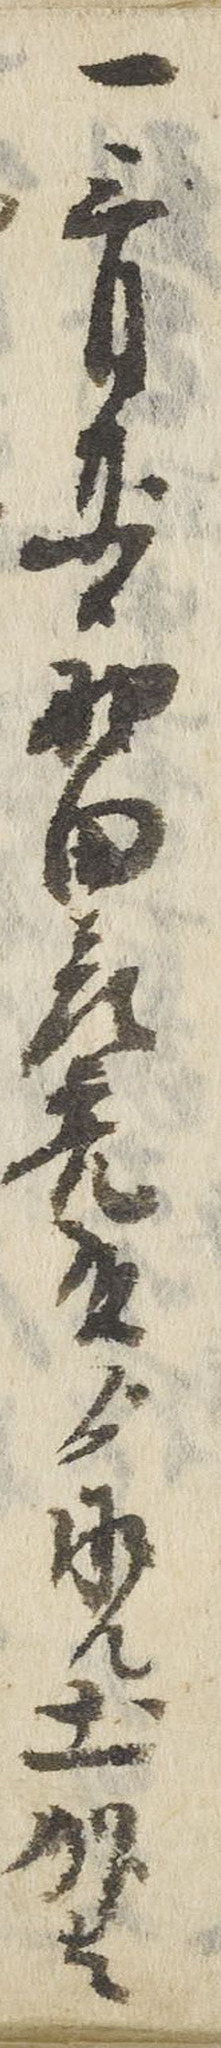一三月廿一日野田彦亮殿ゟ承ル土州は
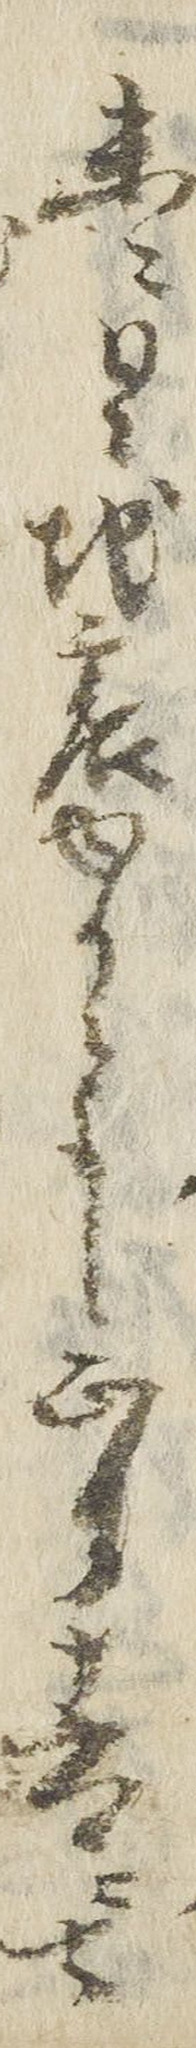未ニ日々地震ゆり候よし正月十六日ニは
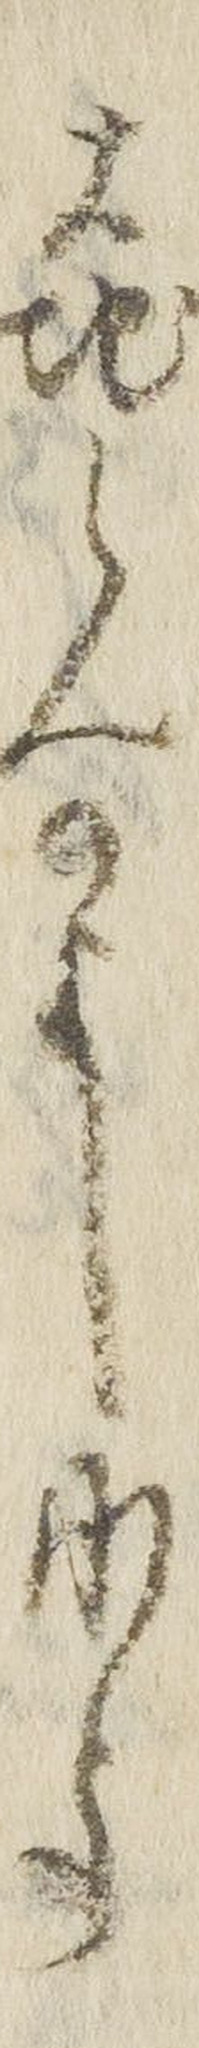大地しんのよし承候事
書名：文政已来異変日記
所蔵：要相談
